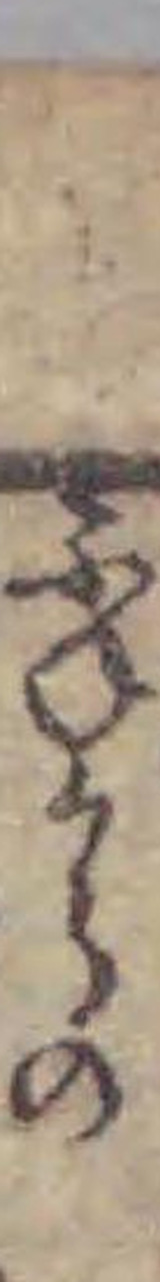ふねからの
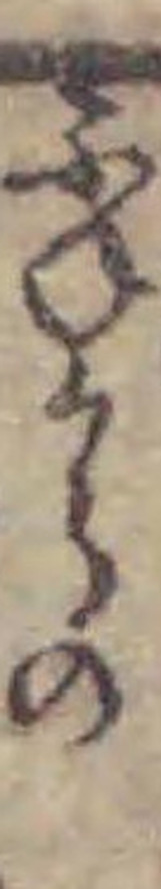ふねからの
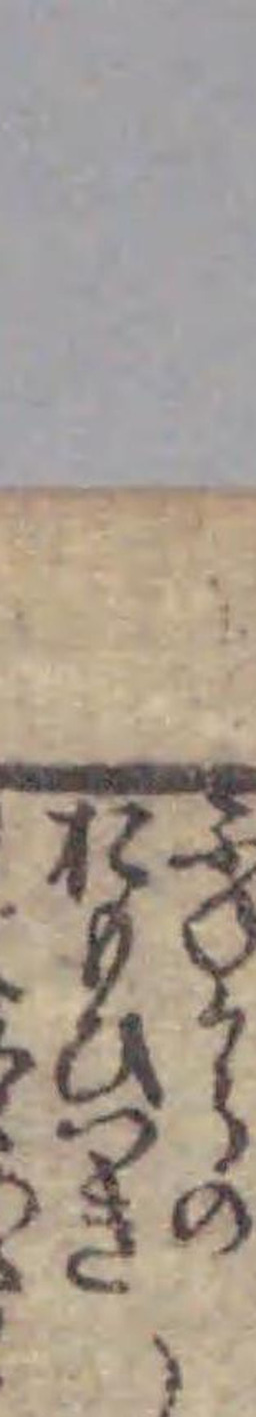おもひつき
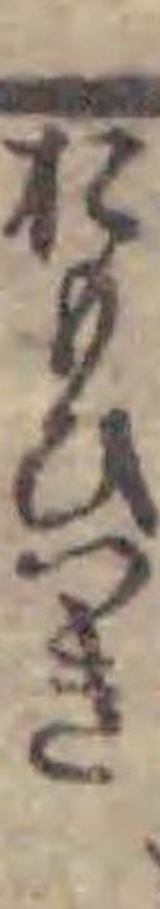おもひつき
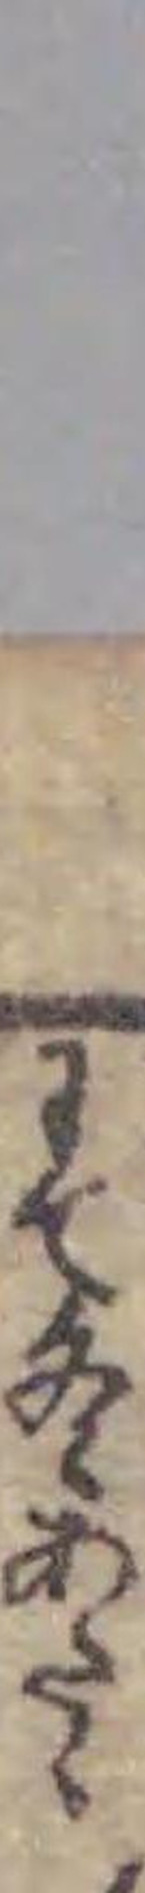にて冬あたゝ
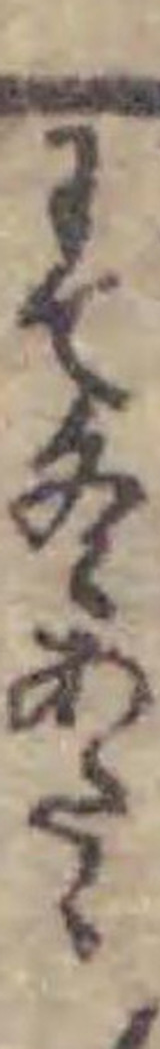にて冬あたゝ
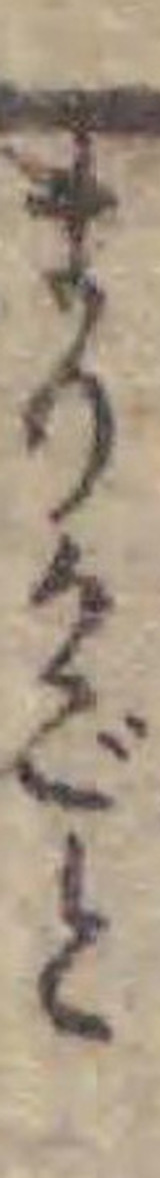まりかごと
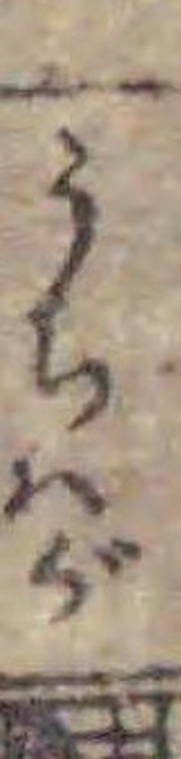うちはが
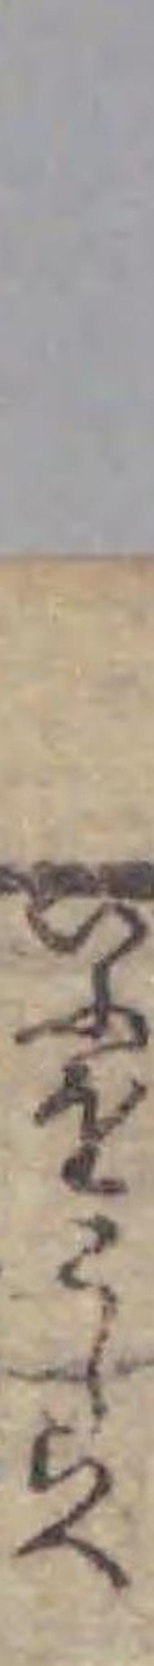いふをこしらへ
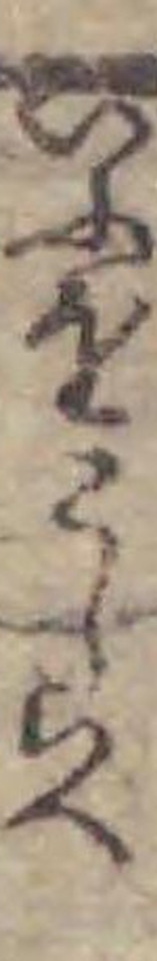いふをこしらへ
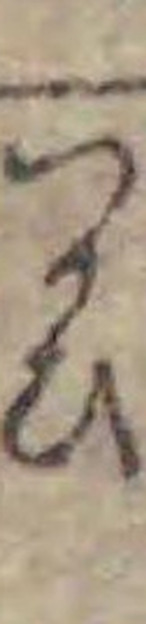つかひ
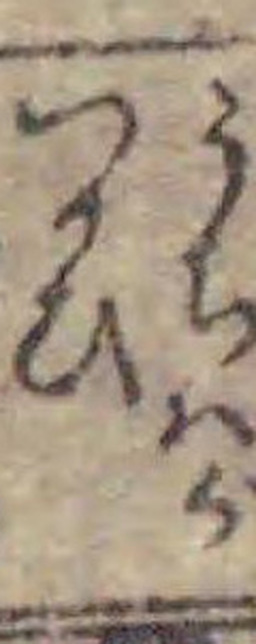つかひ
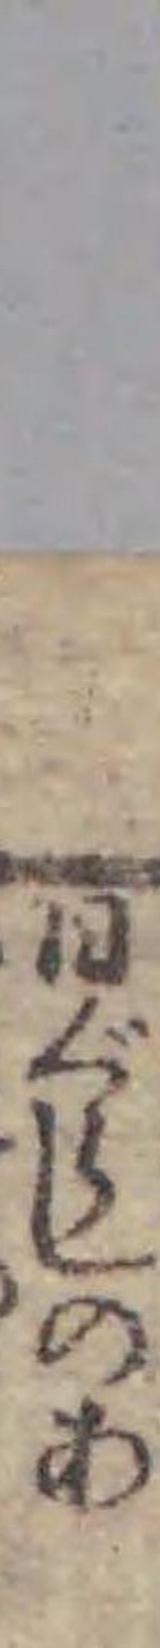日ぐらしのあ
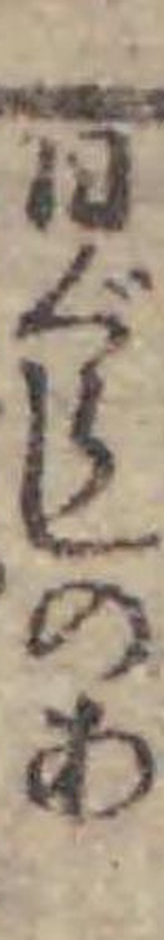日ぐらしのあ
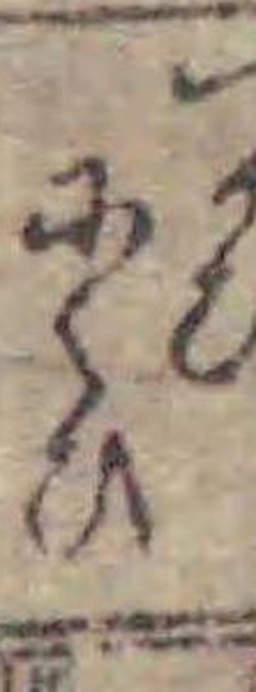にくひ
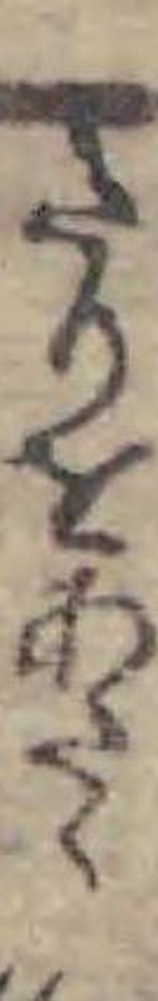たりをあたゝ
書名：本樹真猿浮気噺 : 3巻
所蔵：国立国会図書館 National Diet Library, JAPAN
